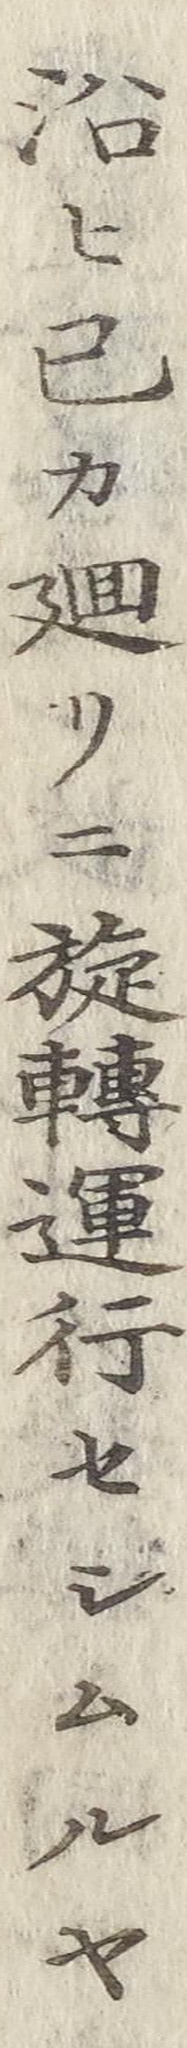沿ヒ己カ廻リニ旋転運行セシムルヤ
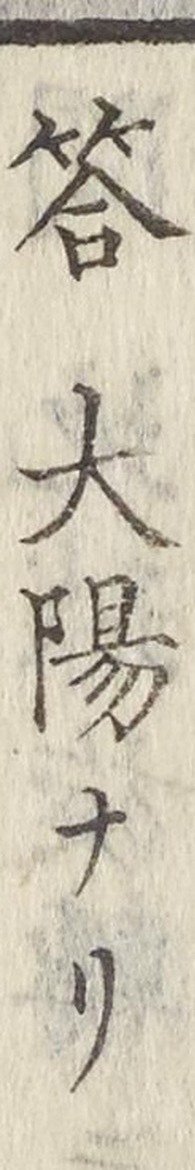答大陽ナリ
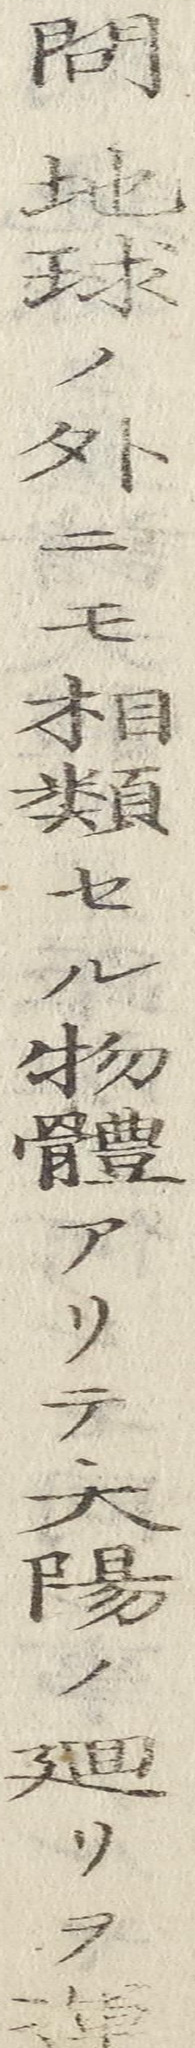問地球ノ外ニモ相類セル物体アリテ大陽ノ廻リヲ運
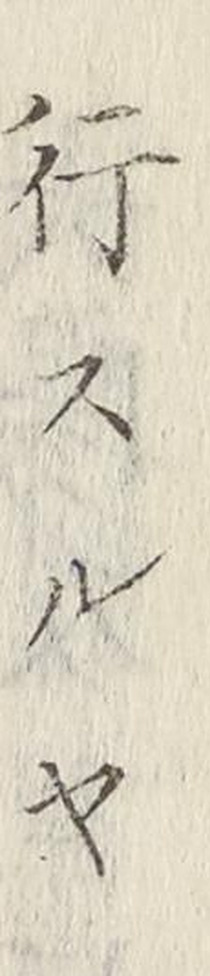行スルヤ
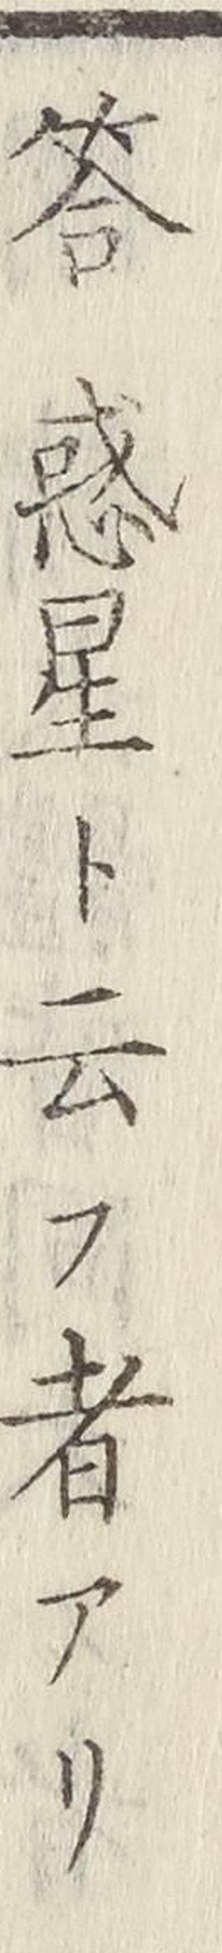答惑星ト云フ者アリ
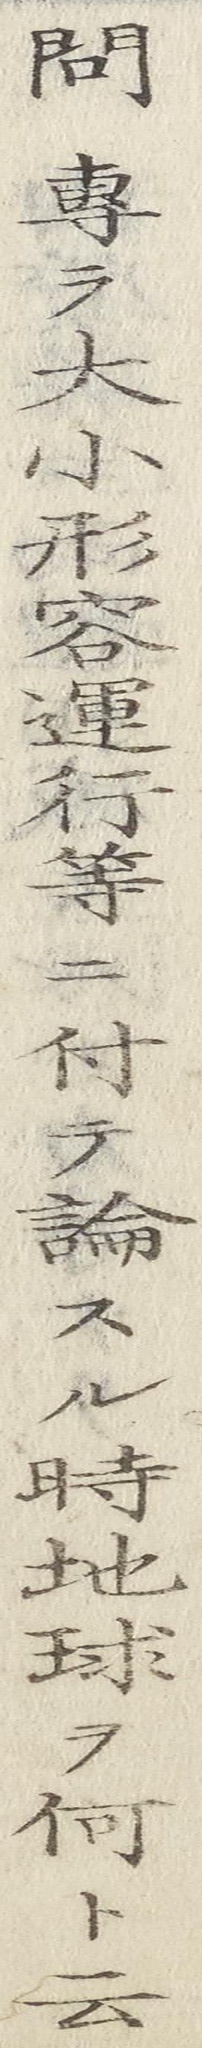問専ラ大小形容運行等ニ付テ論スル時地球ヲ何ト云
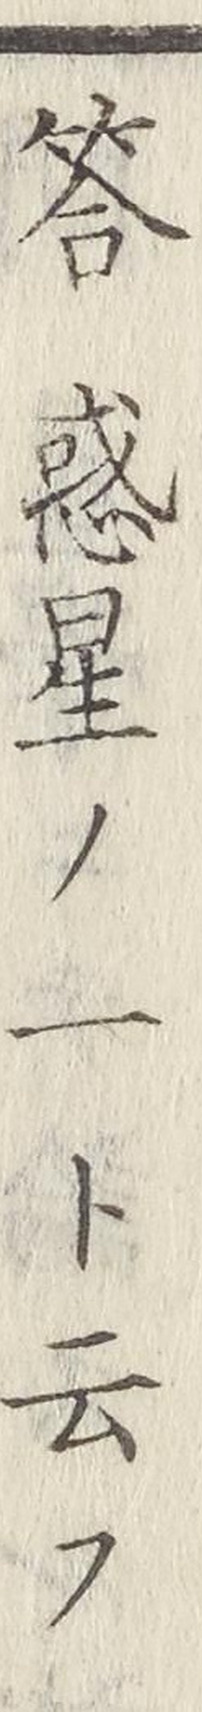答惑星ノ一ト云フ
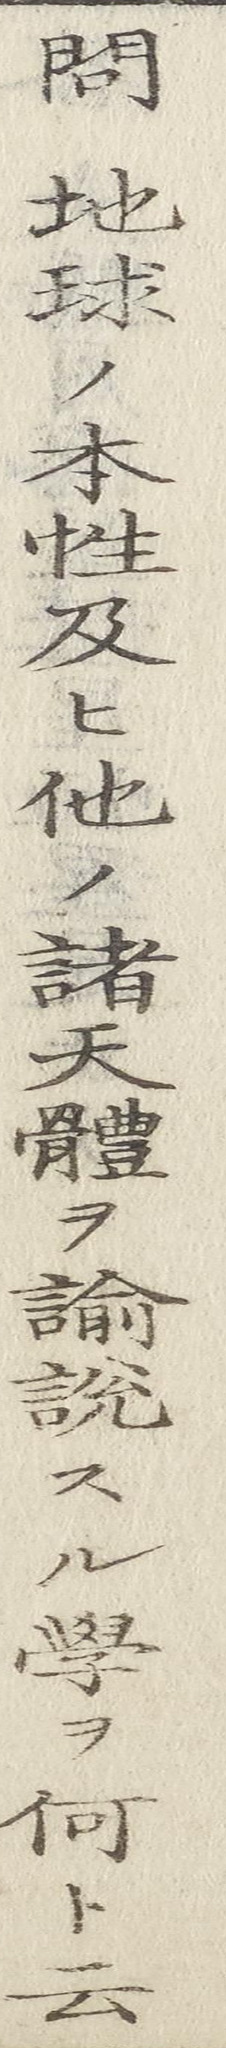問地球ノ本性及ヒ他ノ諸天体ヲ諭説スル学ヲ何ト云
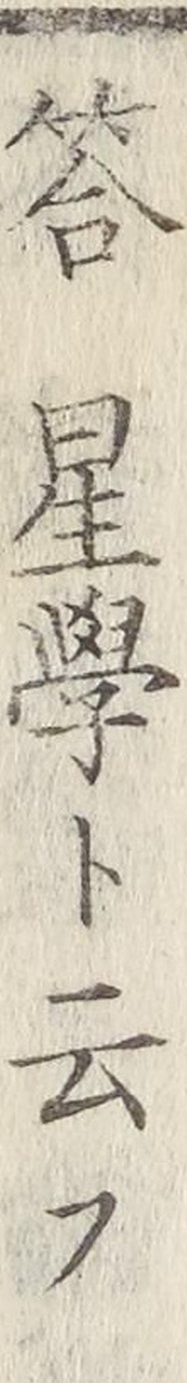答星学ト云フ
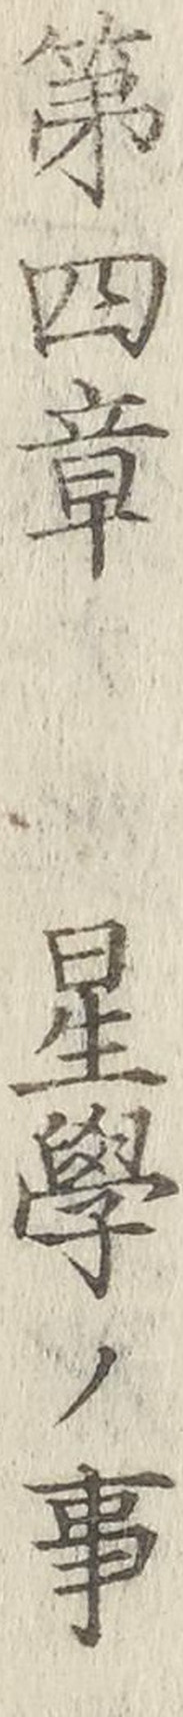第四章星学ノ事

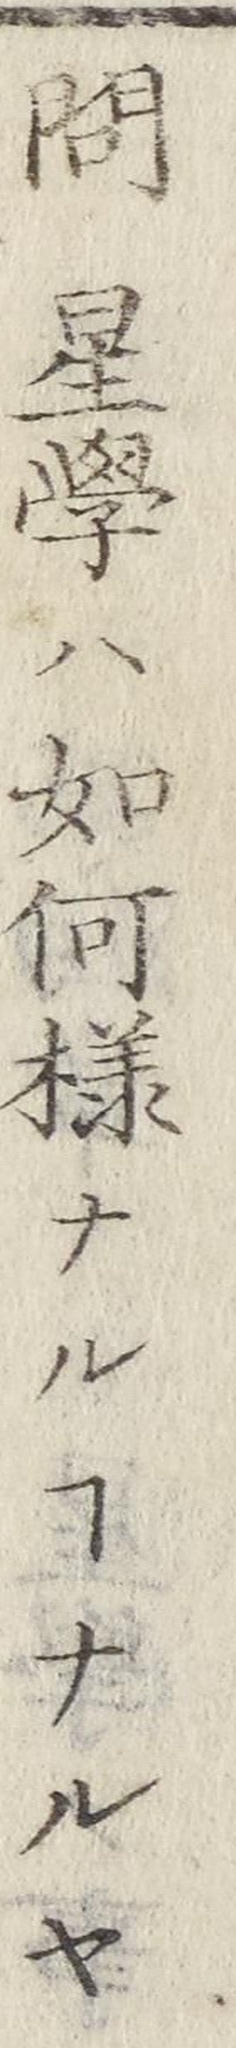問星学ハ如何様ナルコトナルヤ
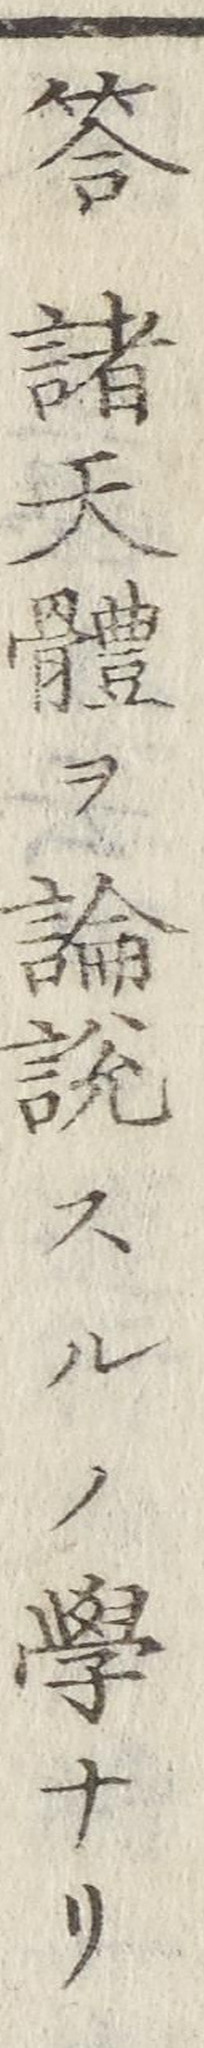答諸天体ヲ論説スルノ学ナリ
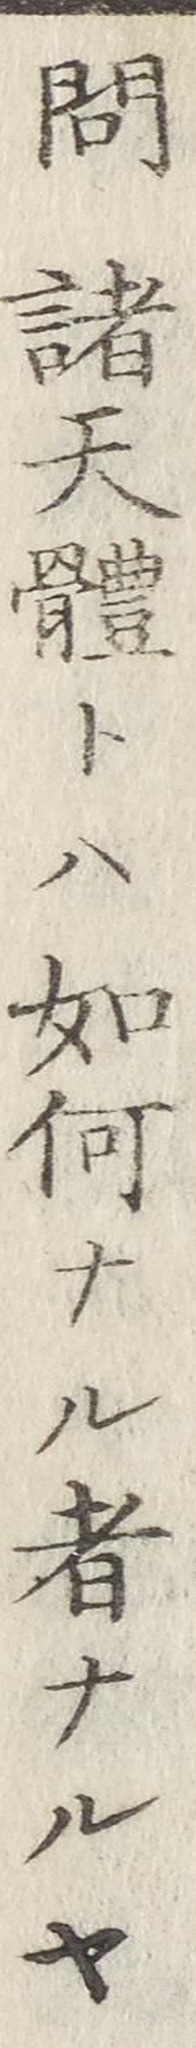問諸天体トハ如何ナル者ナルヤ
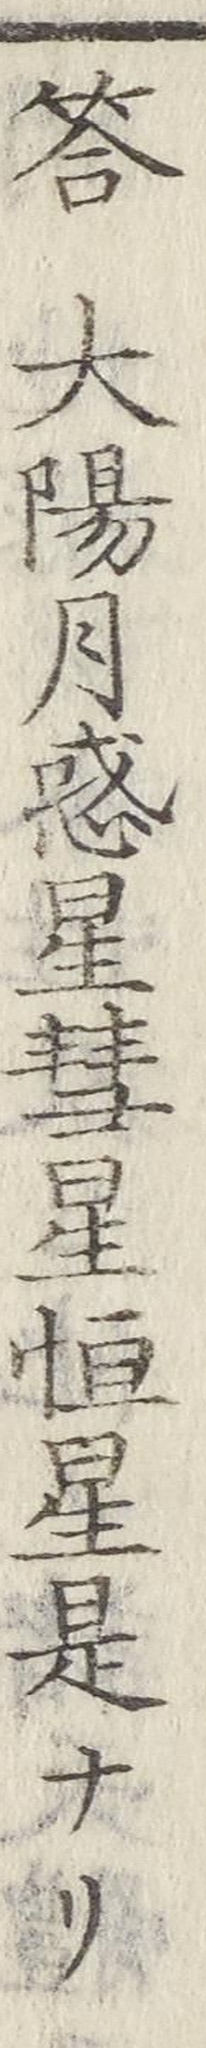答大陽月惑星彗星恒星是ナリ
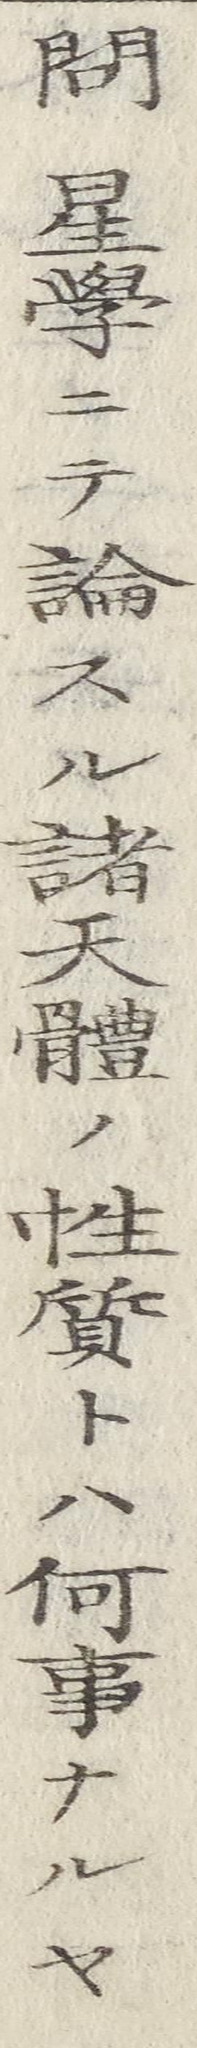問星学ニテ論スル諸天体ノ性質トハ何事ナルヤ
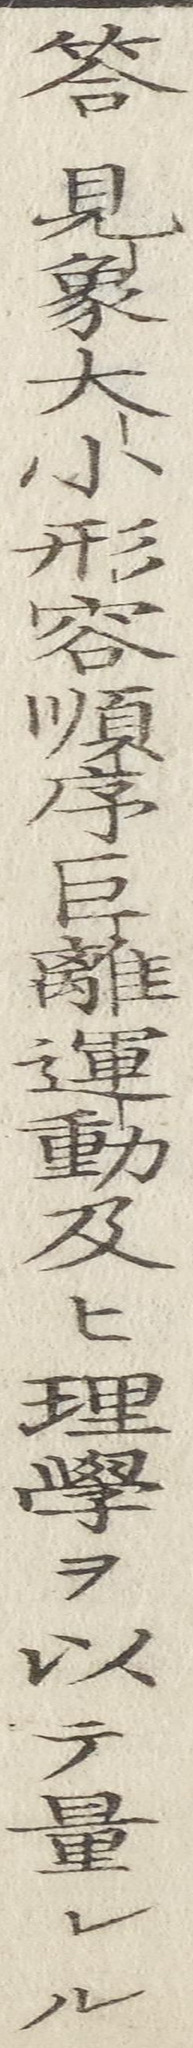答見-象大-小形-容順-序巨-離運-動及ヒ理学ヲ以テ量レル
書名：星学圖説　上
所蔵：東京大学地震研究所図書室 Earthquake Research Institute Library, The University of Tokyo, JAPAN
